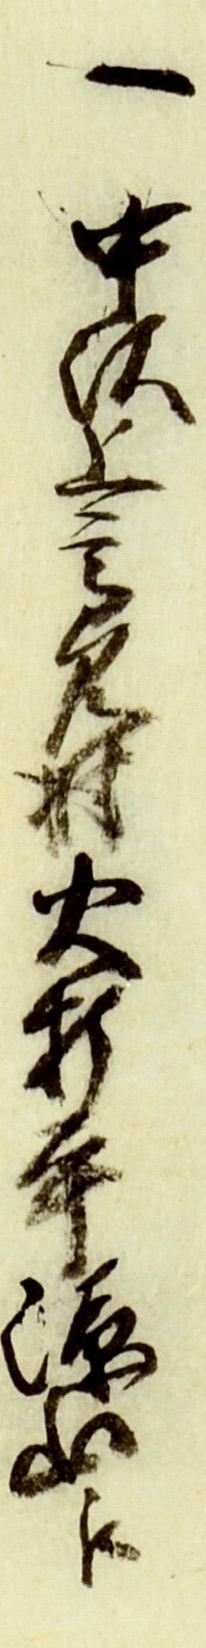一中沢上高見村火打平源山江
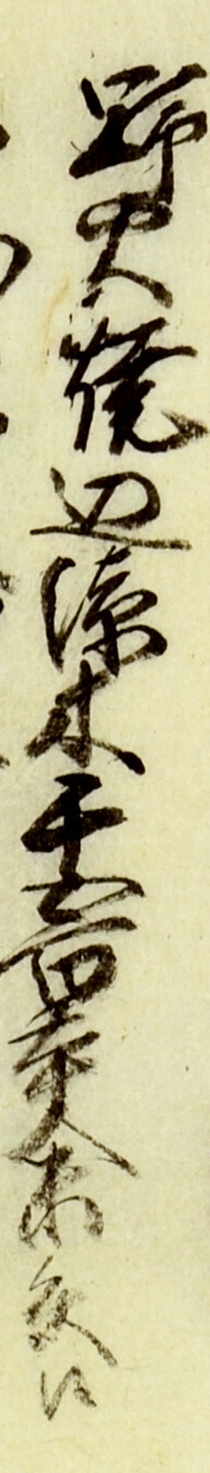野火焼込漆木千五百本余失候
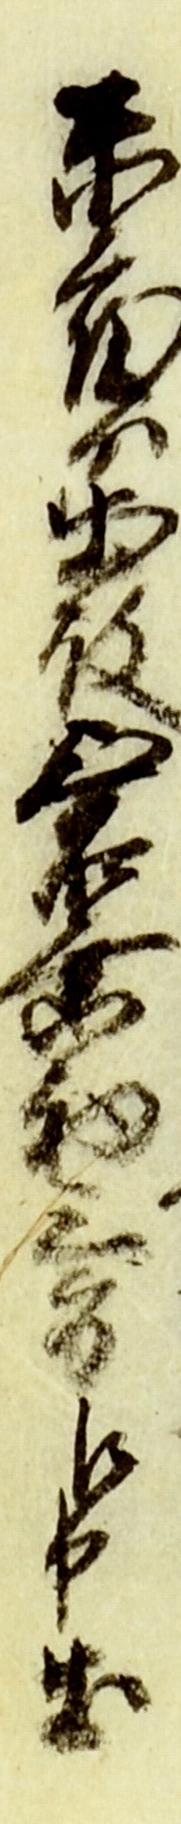末蔵ゟ出役岩垂初三方江申出
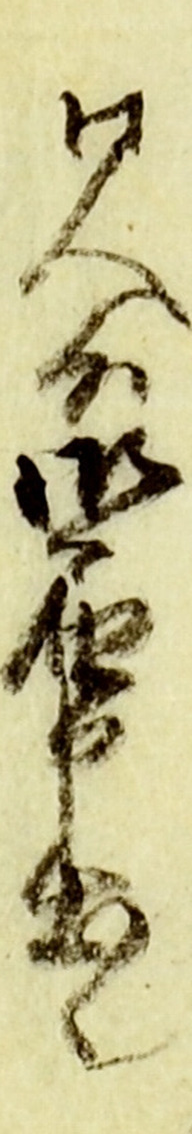同人ゟ御届申出候
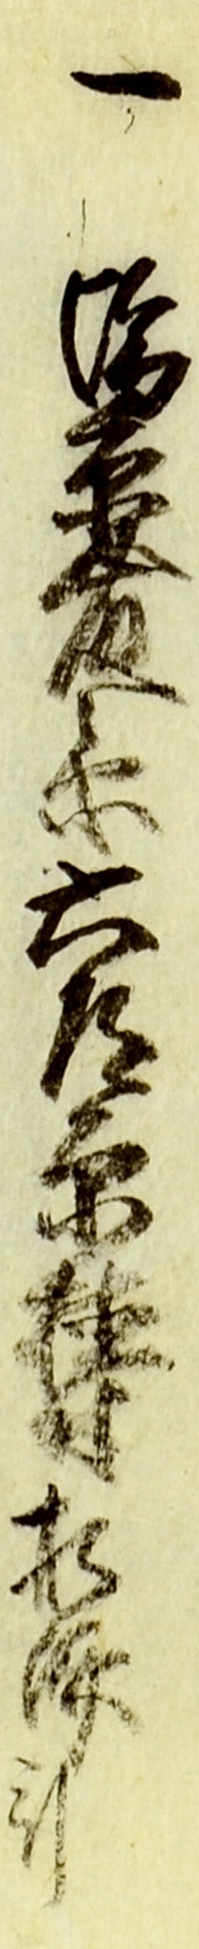一塩原藤兵衛六道原植付相済引
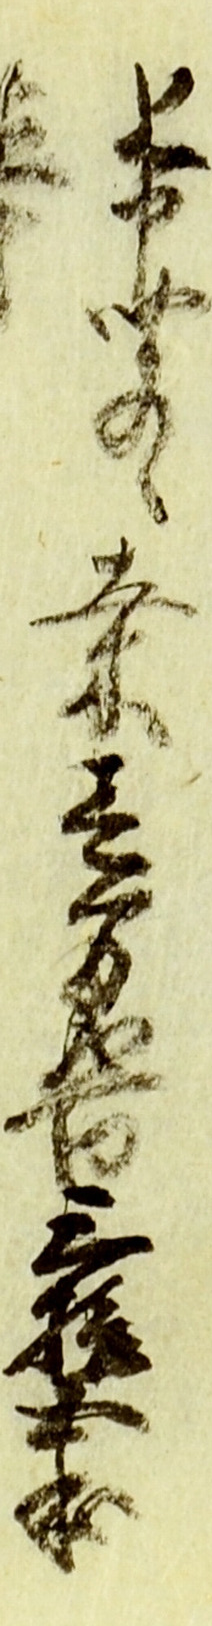上申聞候桑壱万弐百三拾五本

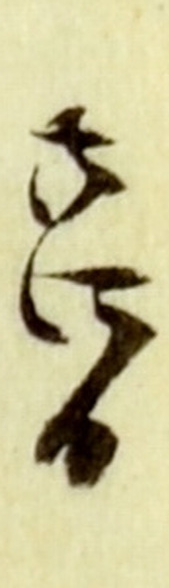廿四日
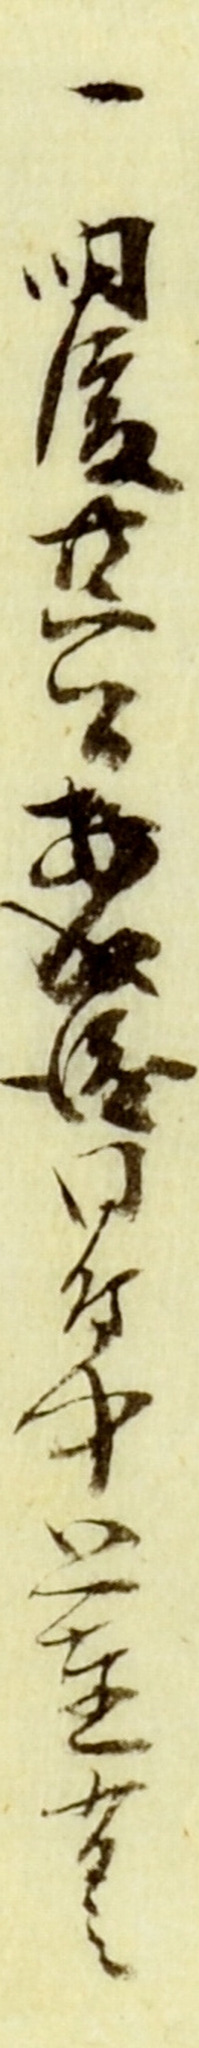一明後廿六日相成後目付中上達有之
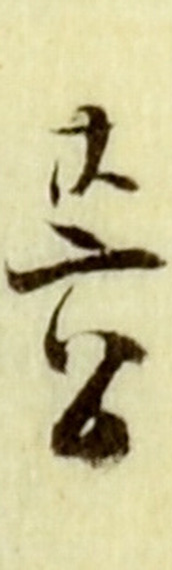廿六日
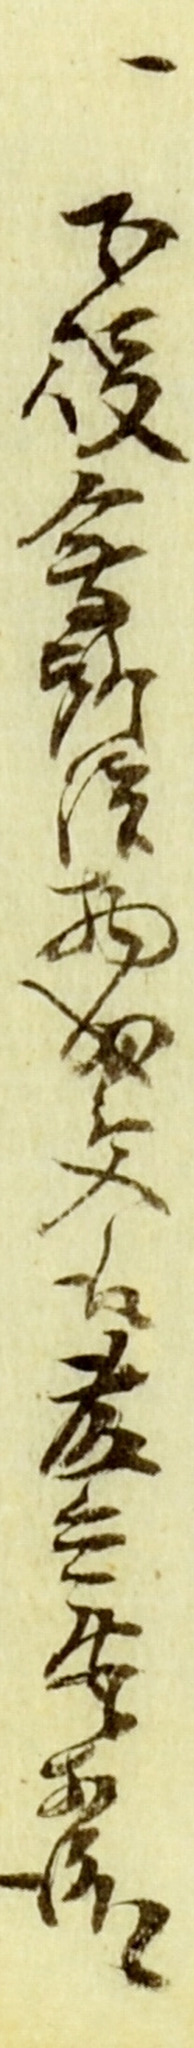一下役会所詰物成受取藤兵衛相渡候
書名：諸事御用留
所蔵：伊那市立高遠町図書館・合同会社AMANE
